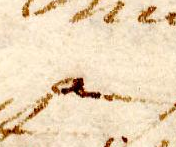a
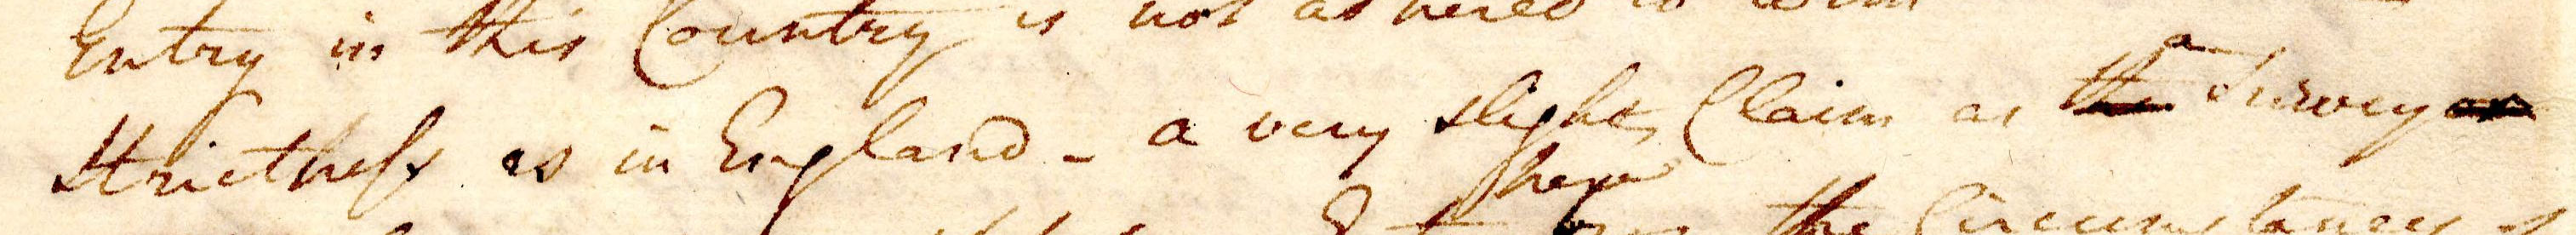Strictness as in England. a very slight Claim as [the] Survey [__]
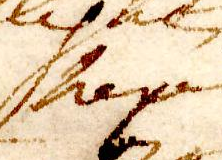here
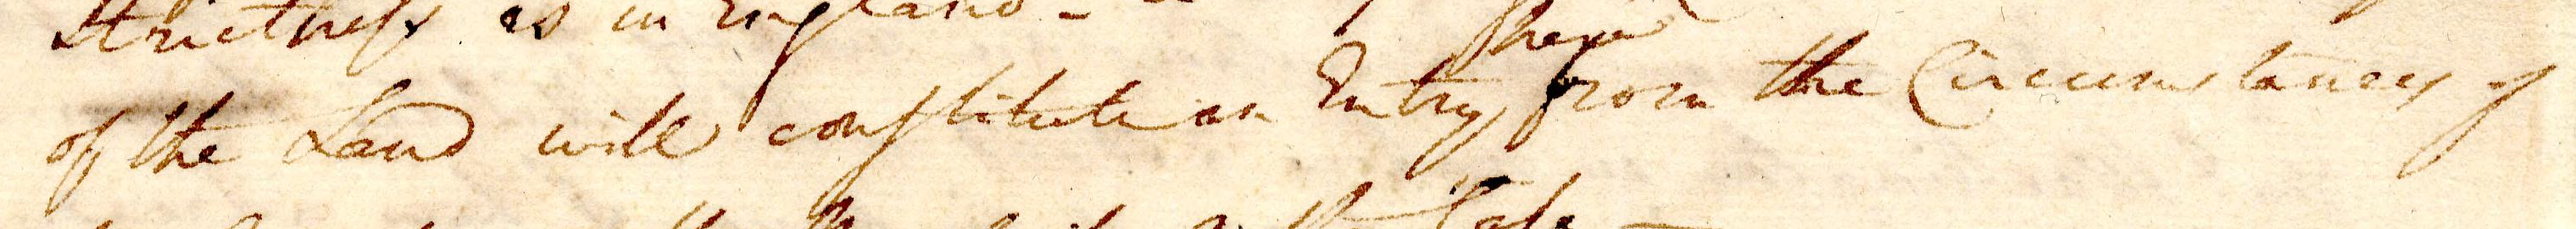of the Land will constitute an Entry ^ from the Circumstances of
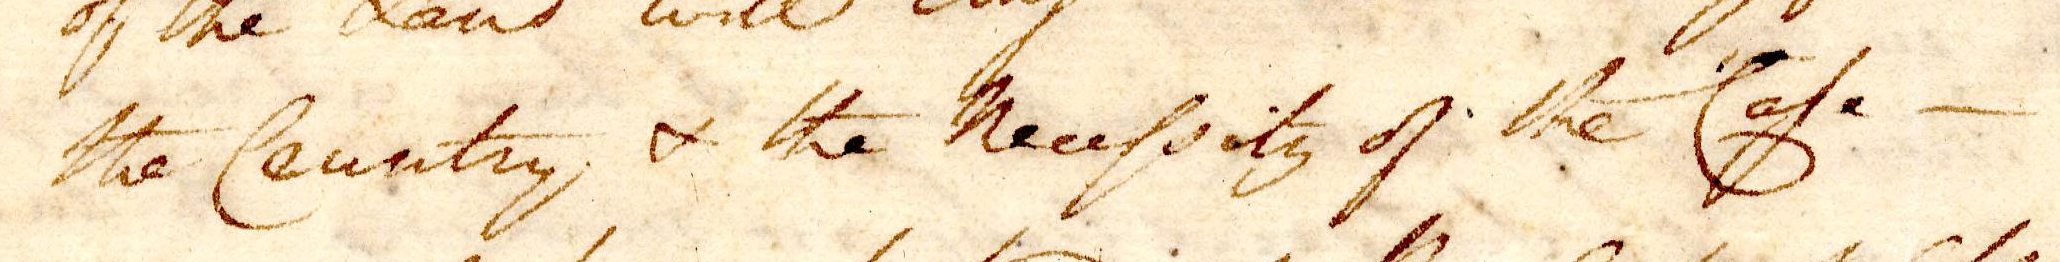the Country & the Necessity of the Case.
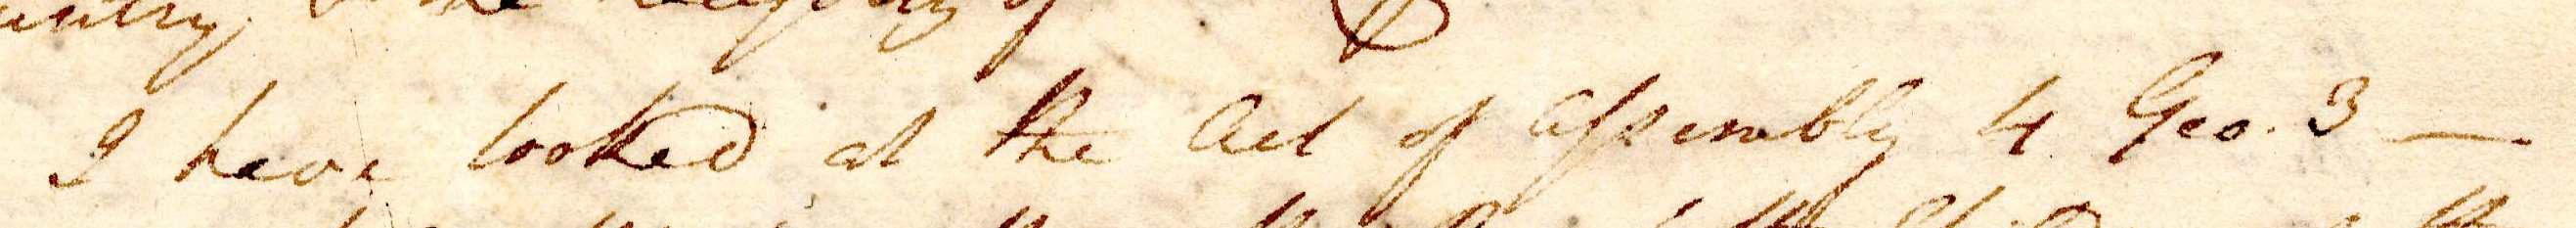I have looked at the Act of Assembly 4 Geo. 3-
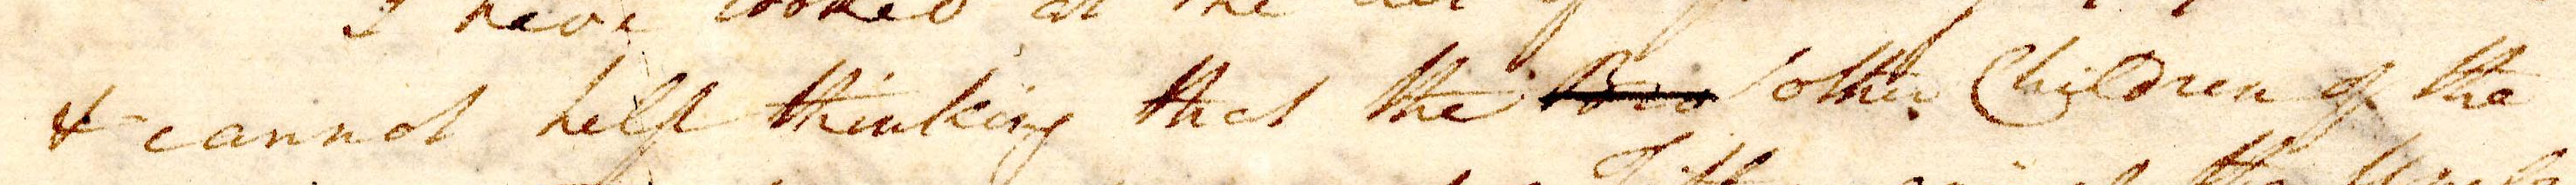& cannot help thinking that the [Bro] other Children of the
